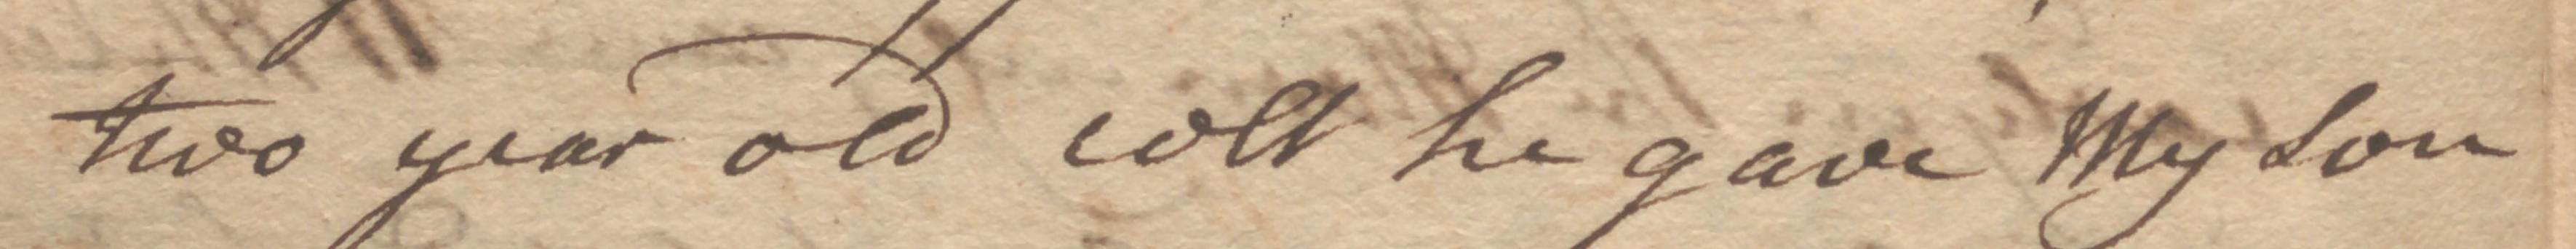two year old colt he gave My son
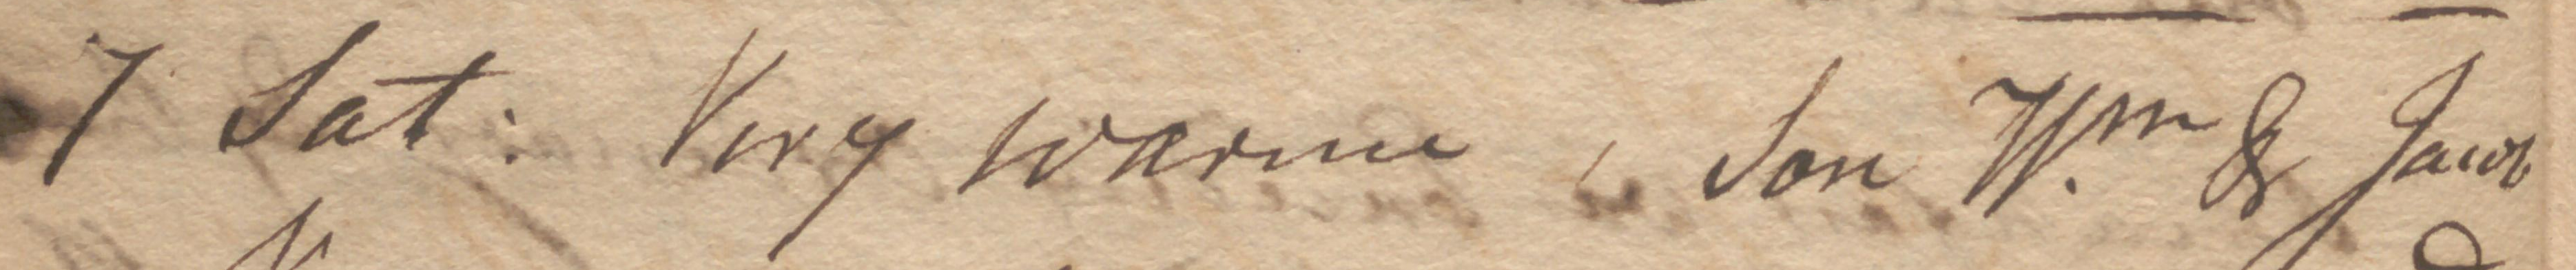7 Sat. Very warme. Son W^m. & Jacob
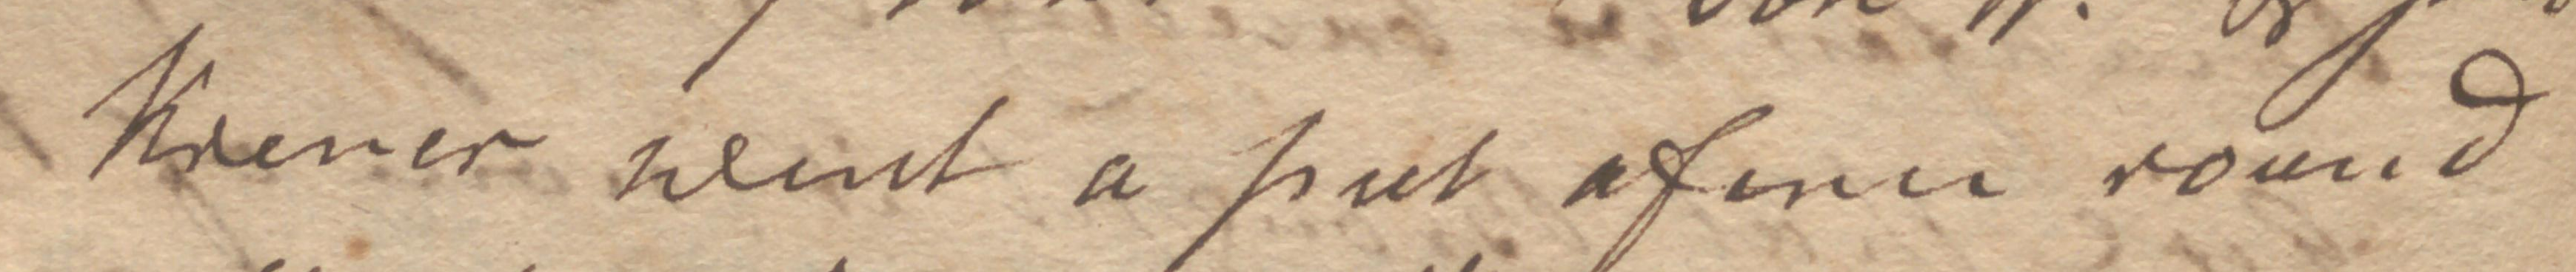Krener went a put a fence round
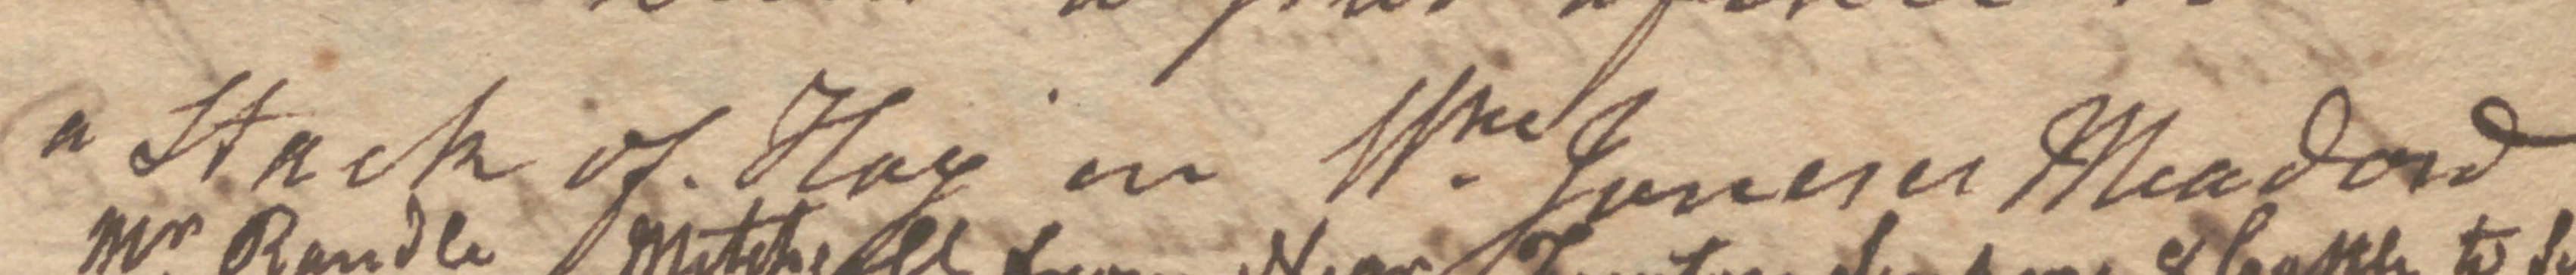a Stack of Hay in W^m. Joneses Meadow
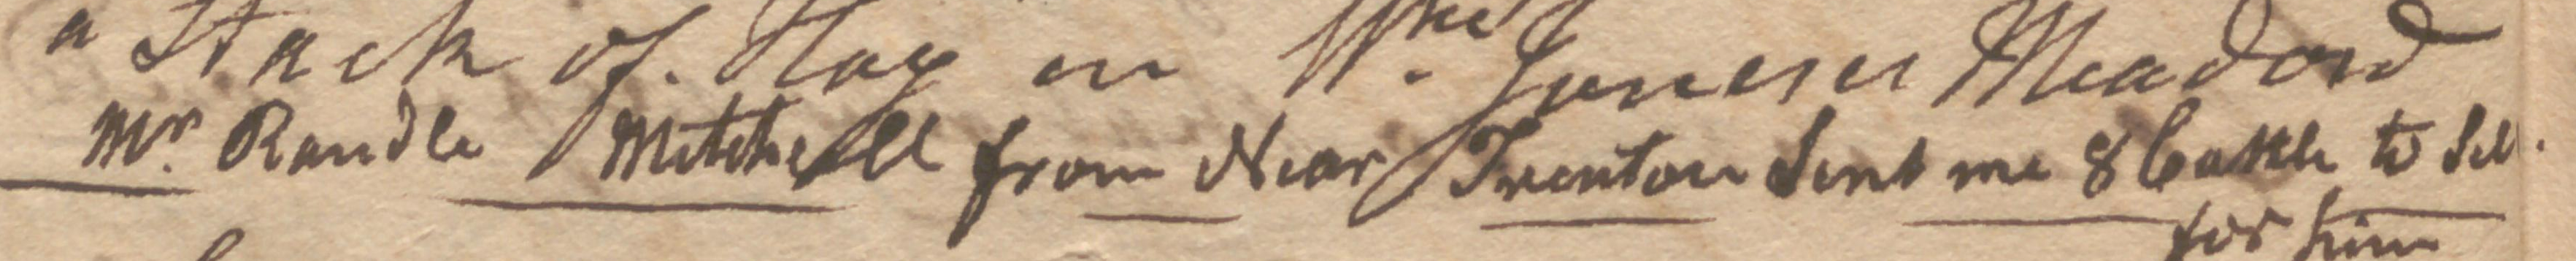M^r. Randle Mitchell from Near Trenton sent me 8 Cattle to Sell
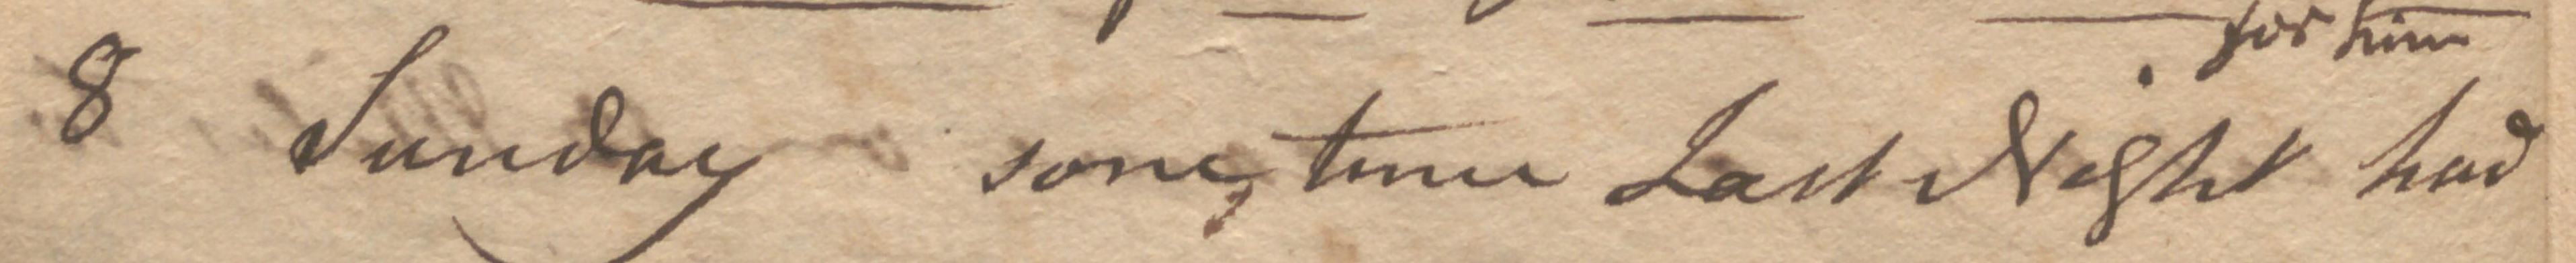8 Sunday some time Last Night had
